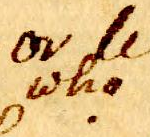who
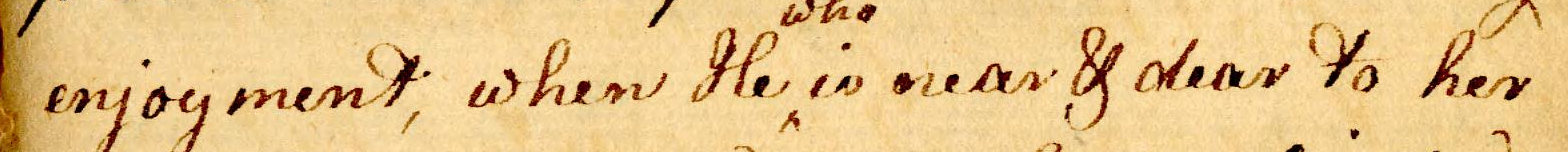enjoyment, when He ^ is near & dear to her
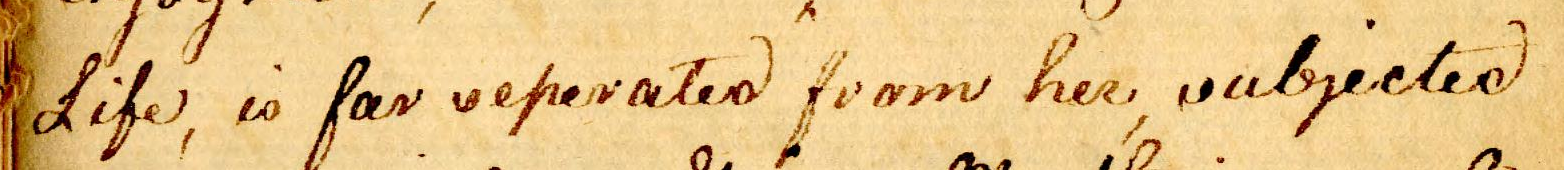Life, is far seperated from her, subjected
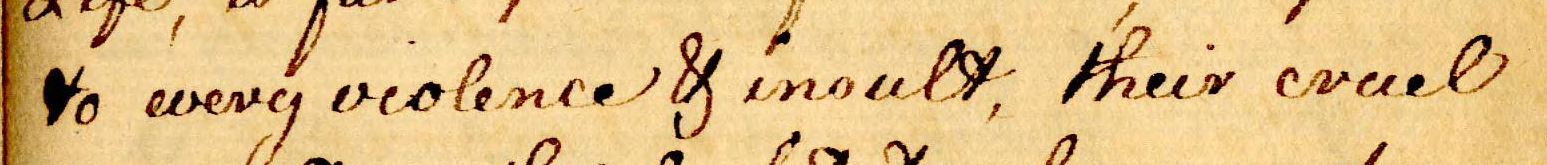to every violence & insult, their cruel
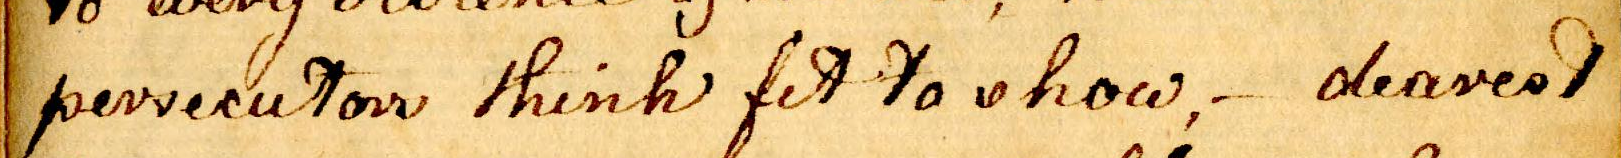persecuton think fit to show- dearest
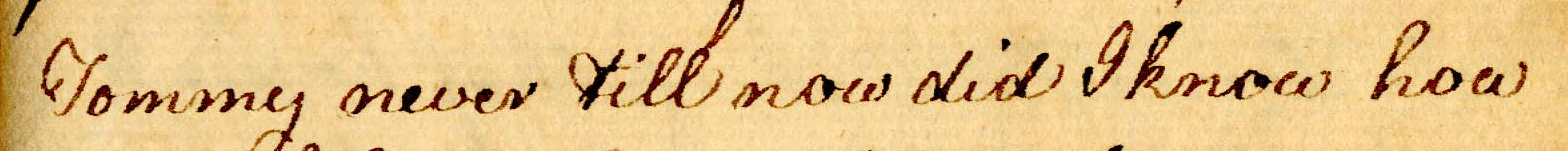Tommy never till now did I know how
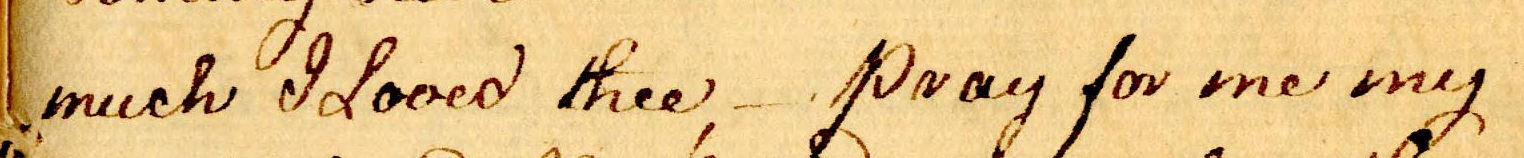much I Loved thee,- Pray for me my
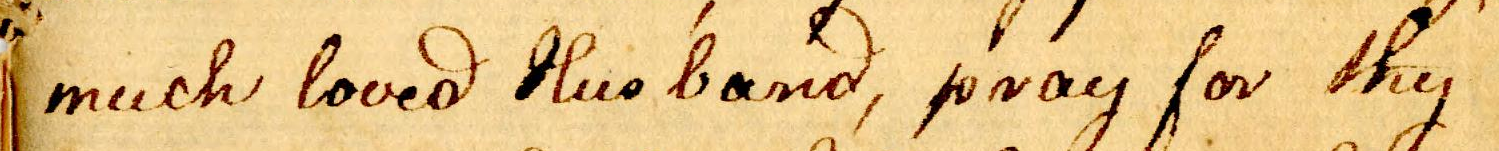much loved Husband, pray for thy
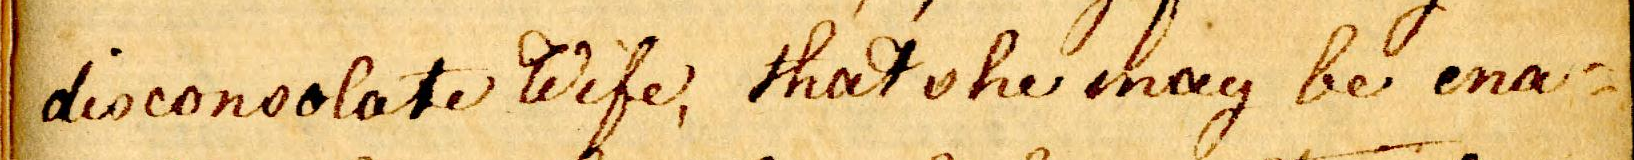disconsolate Wife, that she may be ena-
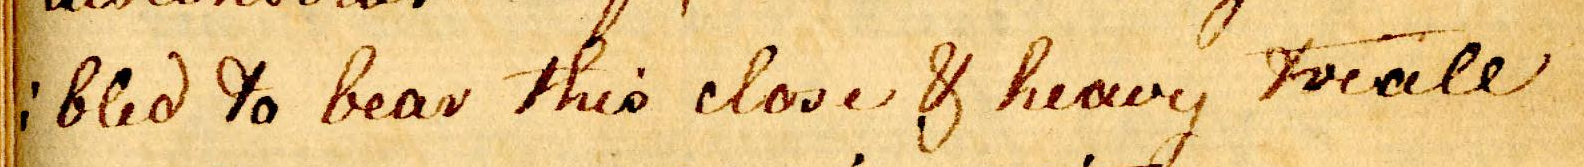-bled to bear this close & heavy triall
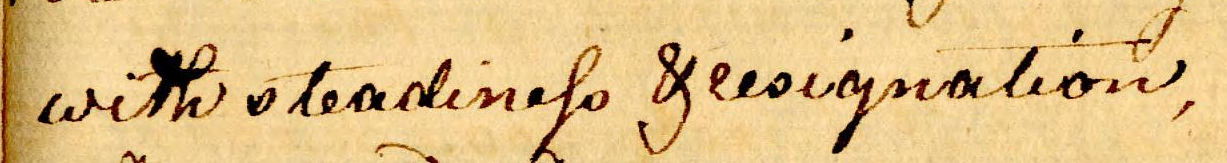with steadiness & resignation,
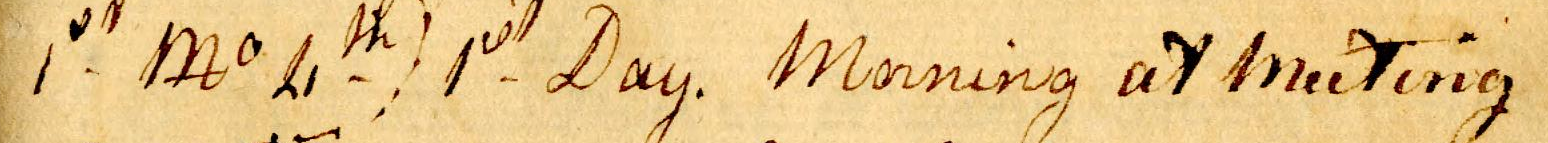1^st M^o 4^th) 1^st Day. Morning at Meeting
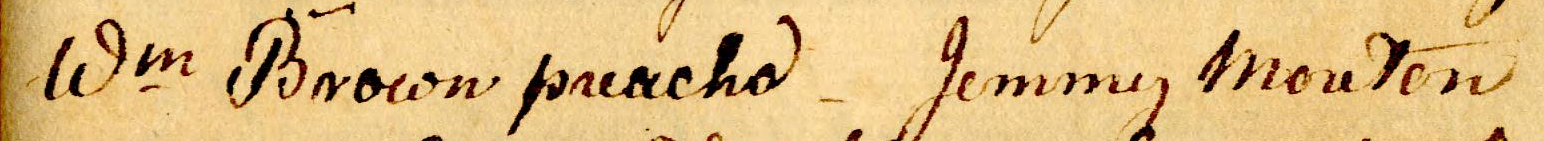W^m Brown preachd- Jemmy Moreton
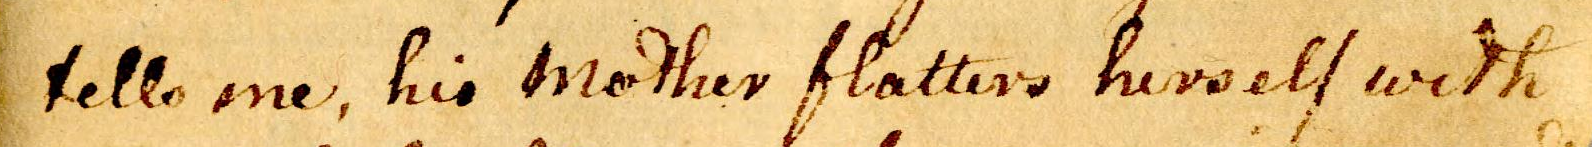tell me, his Mother flatters herself with
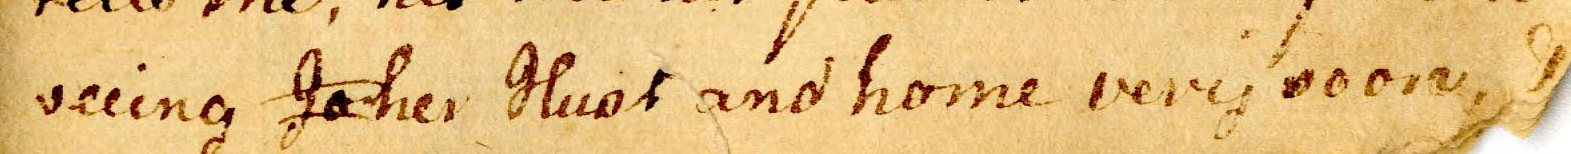seeing [Joher] Hust and home very soon, &
